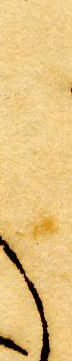To
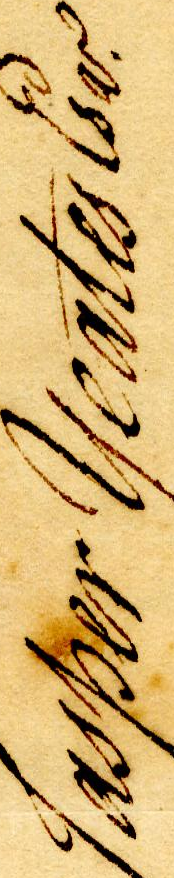Jasper Yeates Esq^r.
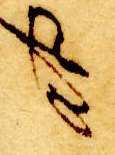at
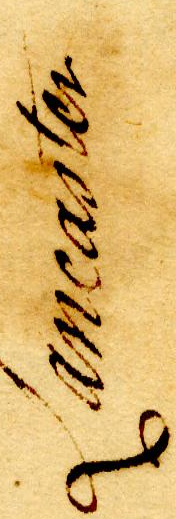Lancaster
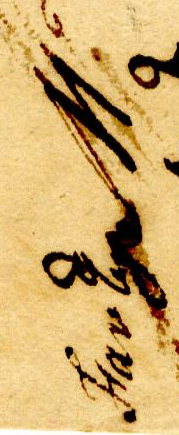Fav E[__] M
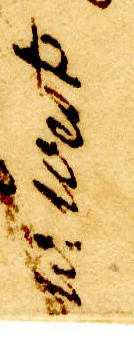W. West
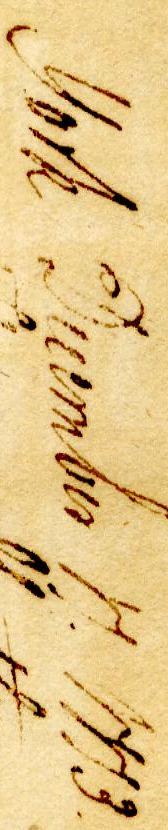York December 17^th. 1773.
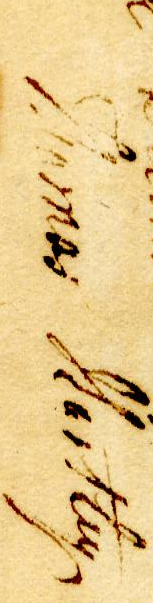Thomas Hartley
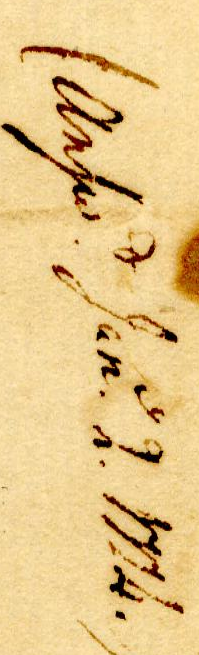(Answ^d. Jan^y. 2. 1774.)
